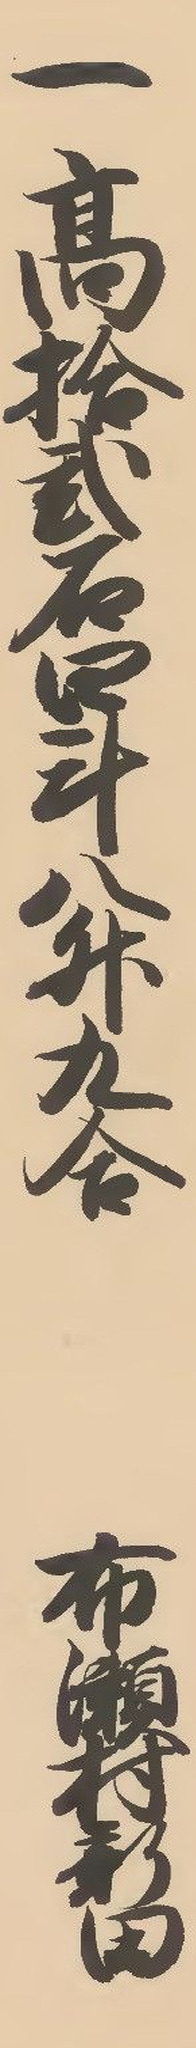一高拾弐石四斗八升九合布瀬村新田
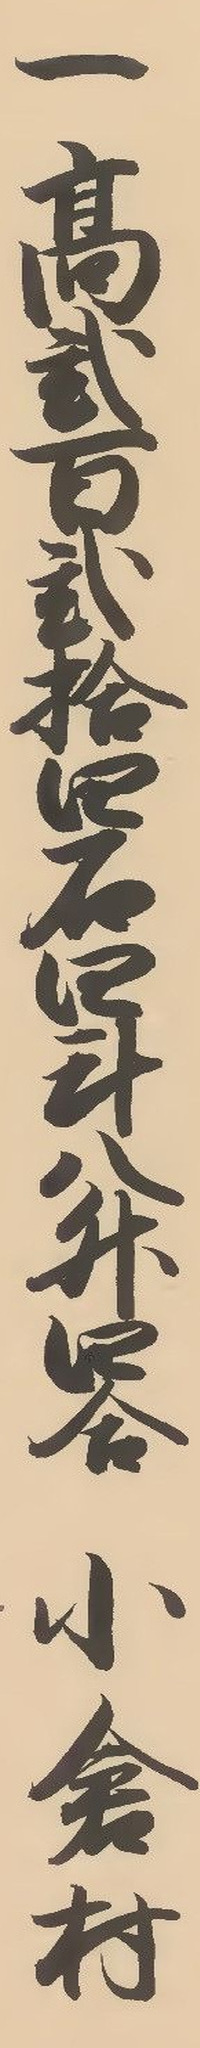一高弐百弐拾四石四斗八升四合小倉村
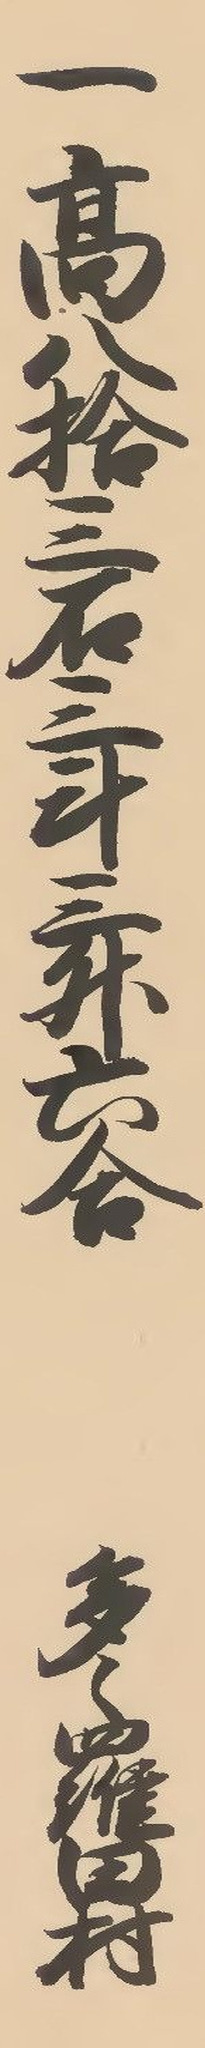一高八拾三石三斗三升六合多々羅田村
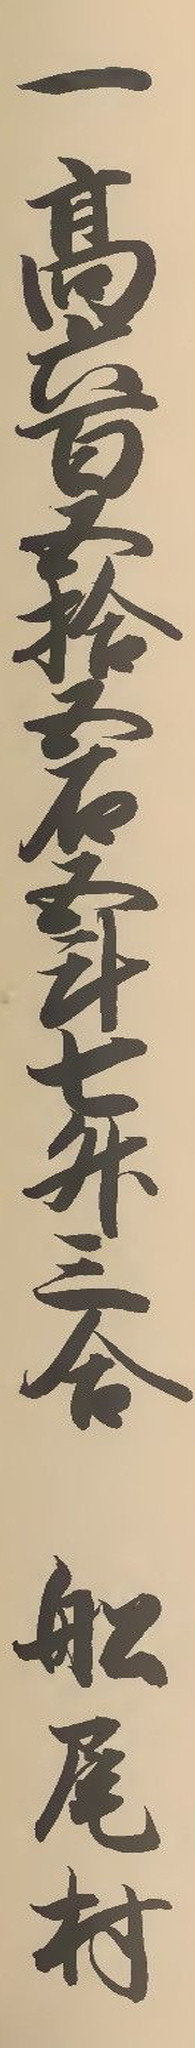一高六百五拾五石五斗七升三合船尾村
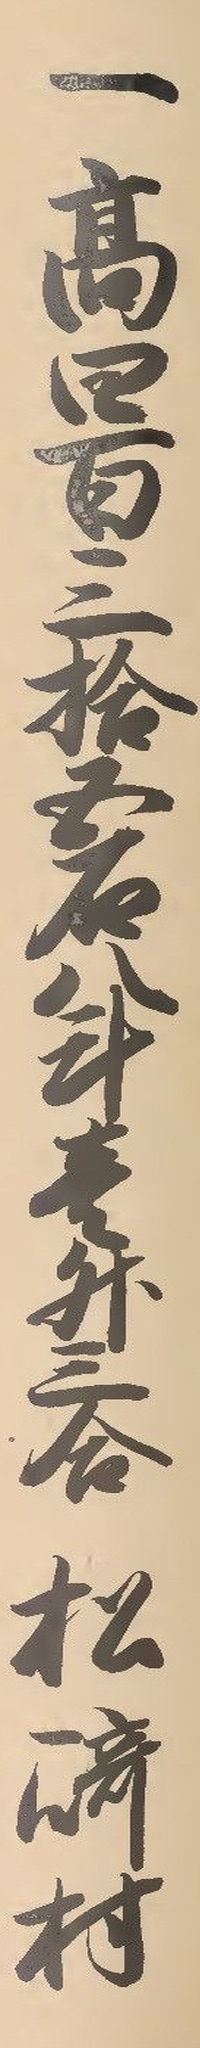一高四百三拾五石八斗壱升三合松崎村
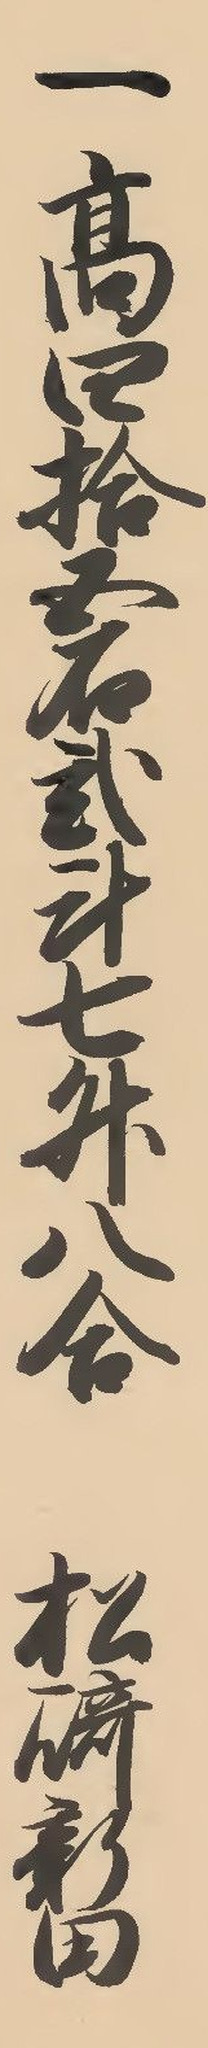一高四拾五石弐斗七升八合松崎新田
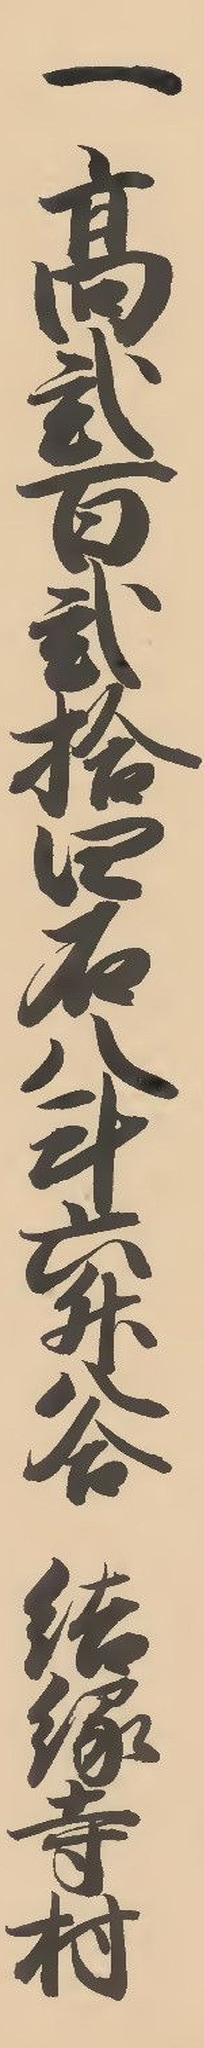一高弐百弐拾四石八斗六升八合結縁寺村
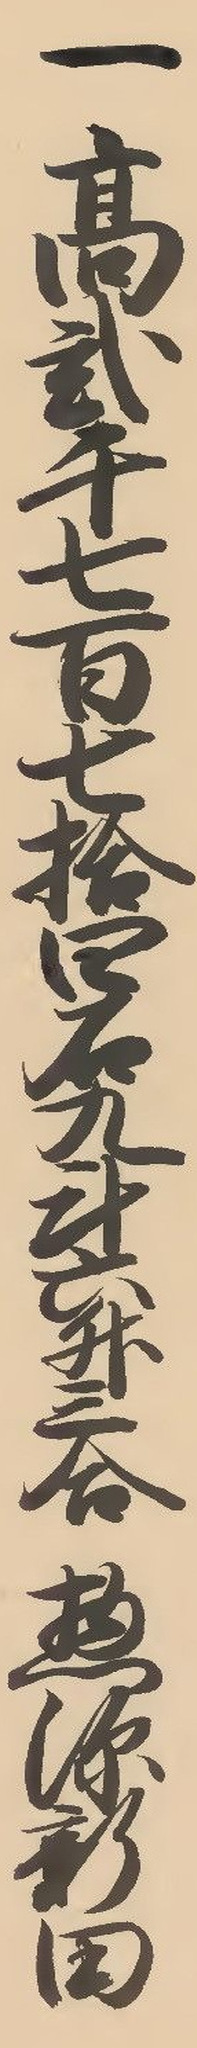一高弐千七百七拾四石九斗六升三合惣深新田

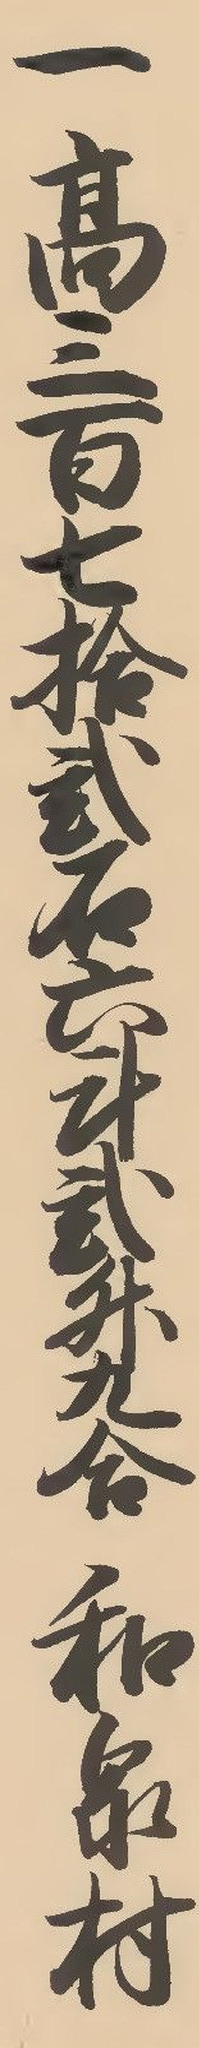一高三百七拾弐石六斗弐升九合和泉村
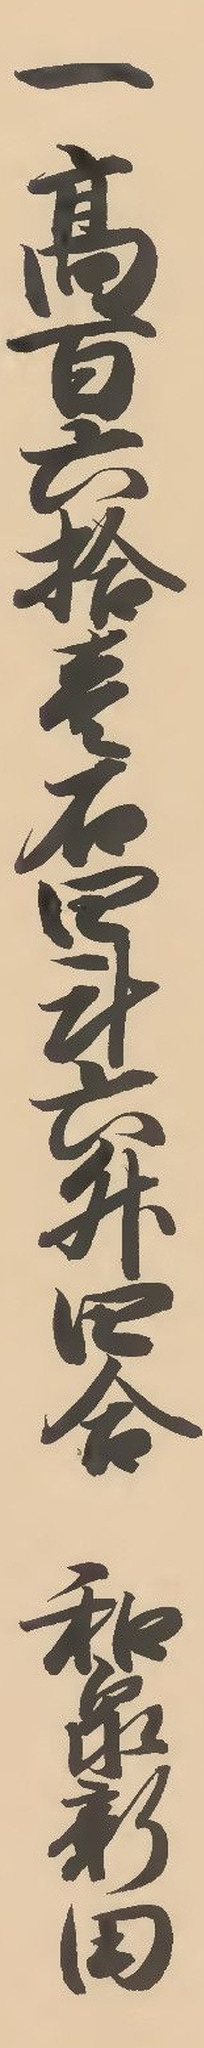一高百六拾壱石四斗六升四合和泉新田
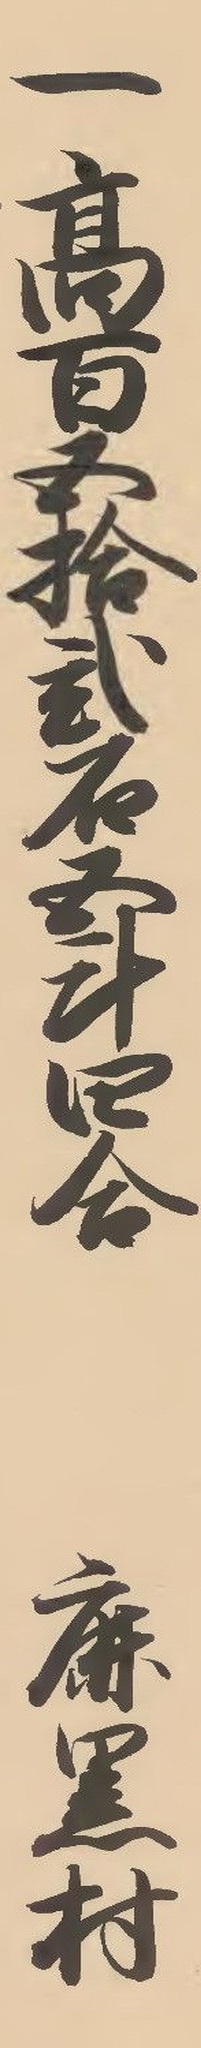一高百五拾弐石五斗四合鹿黒村
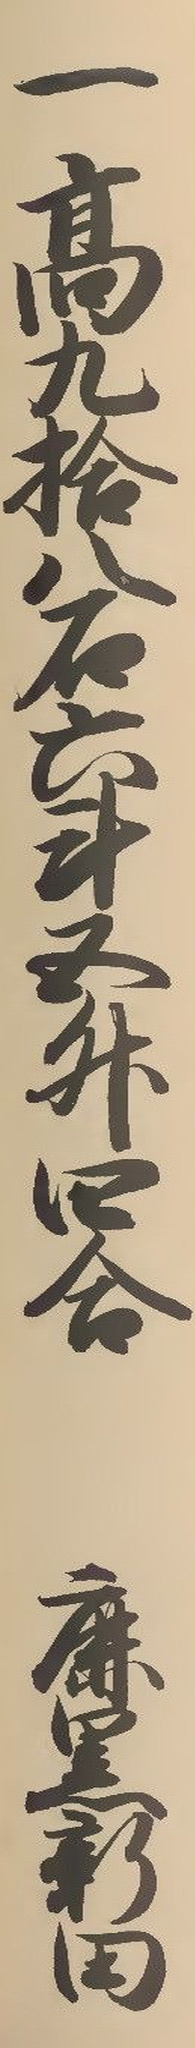一高九拾八石六斗五升四合鹿黒新田
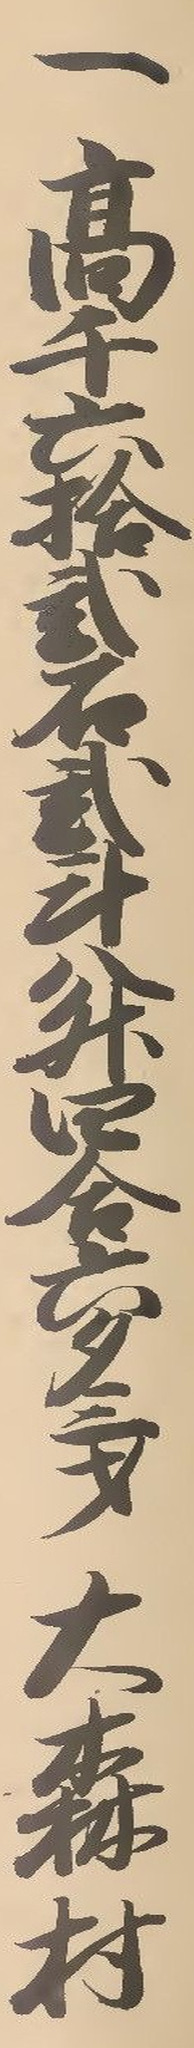一高千六拾弐石弐斗八升四合六勺三才大森村
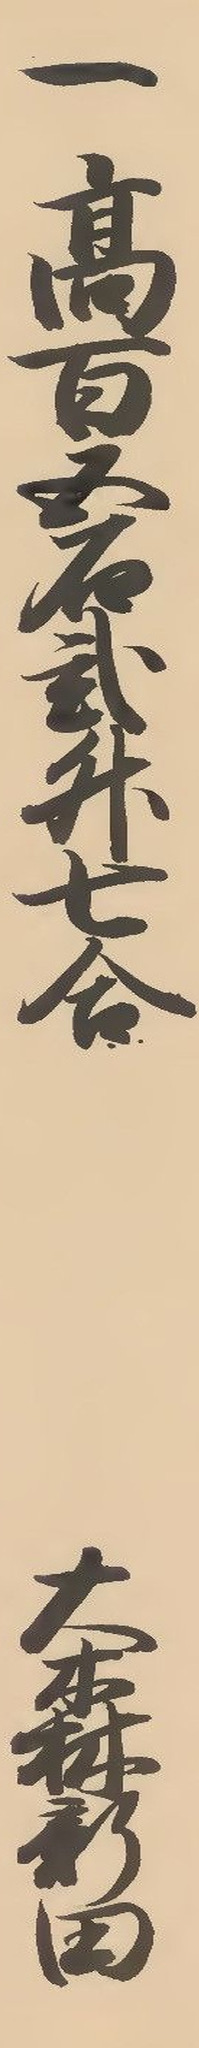一高百五石弐升七合大森新田
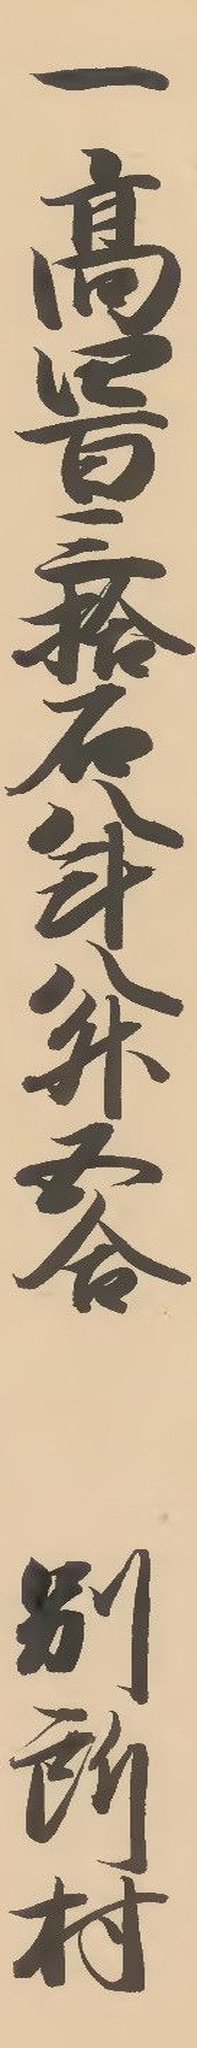一高四百三拾石八斗八升五合別所村
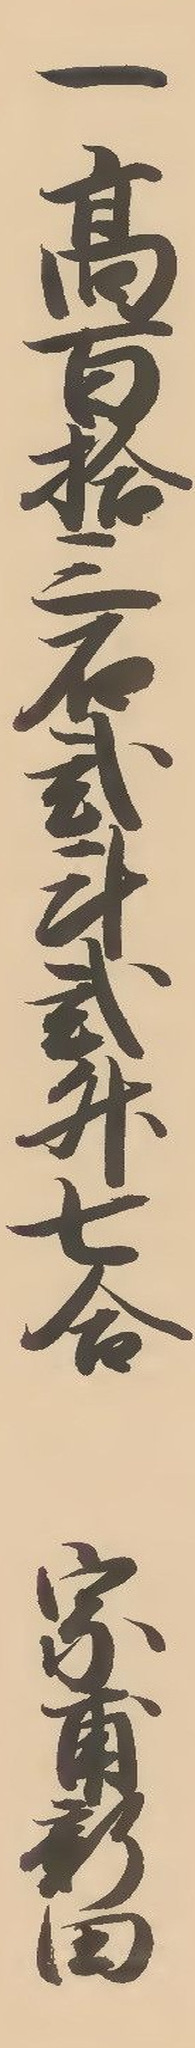一高百拾三石弐斗弐升七合宗甫新田
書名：下総国郷帳
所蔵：国立公文書館 National Archives of Japan
